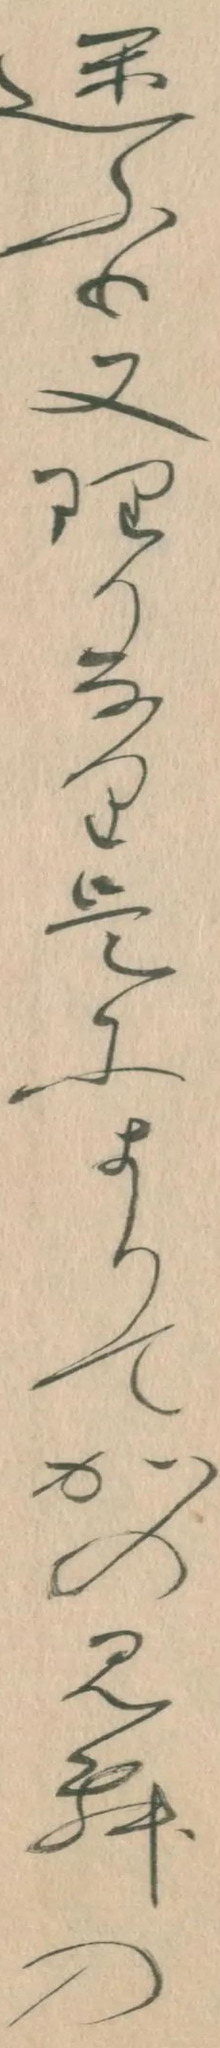迷ふも又理りなり是によりてかの見舞の
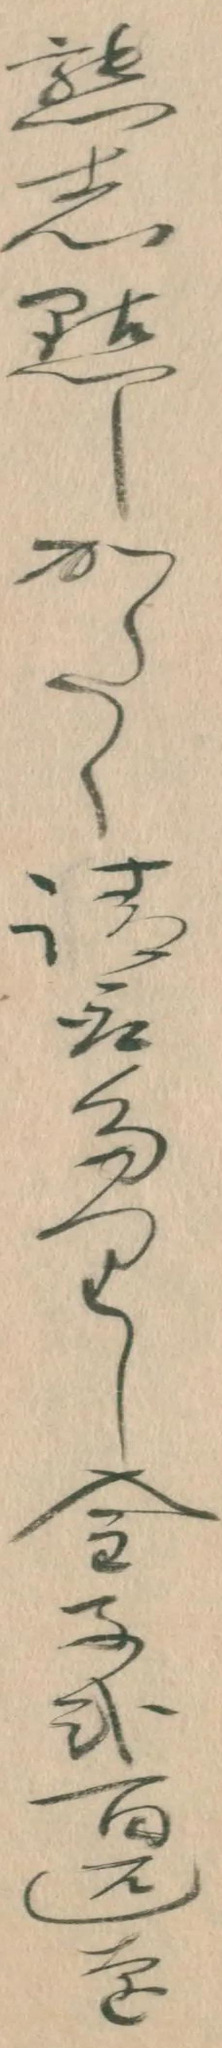懇志黙しかたく請取たりし金子弐百疋を
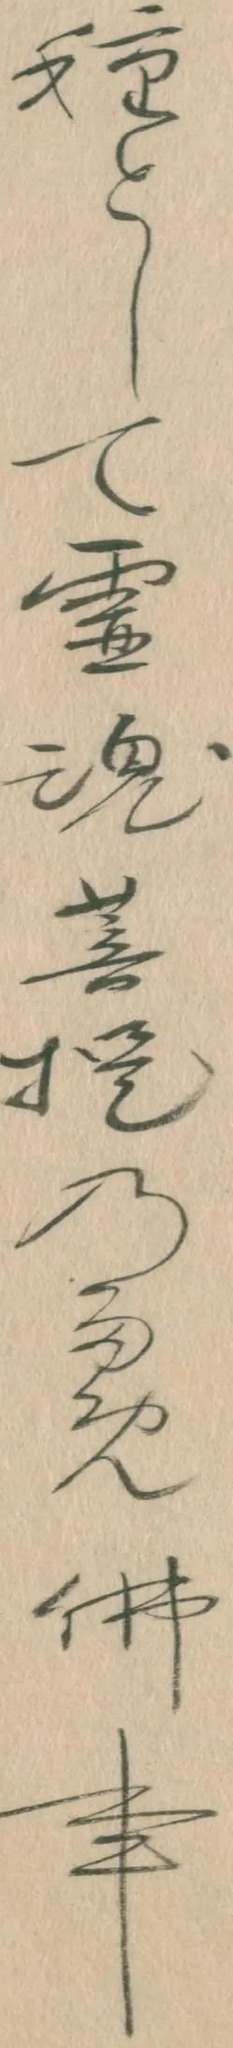種として霊魂菩提のため仏事
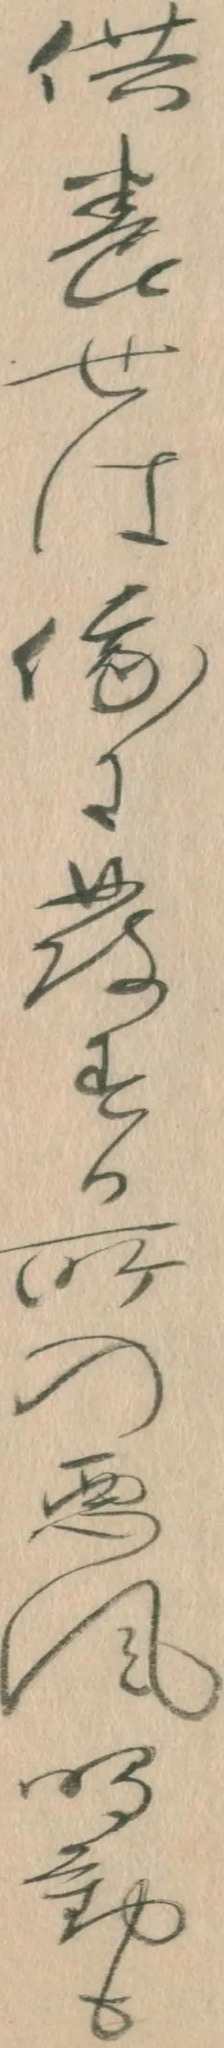供養せは餓に発する所の悪風鳴動も
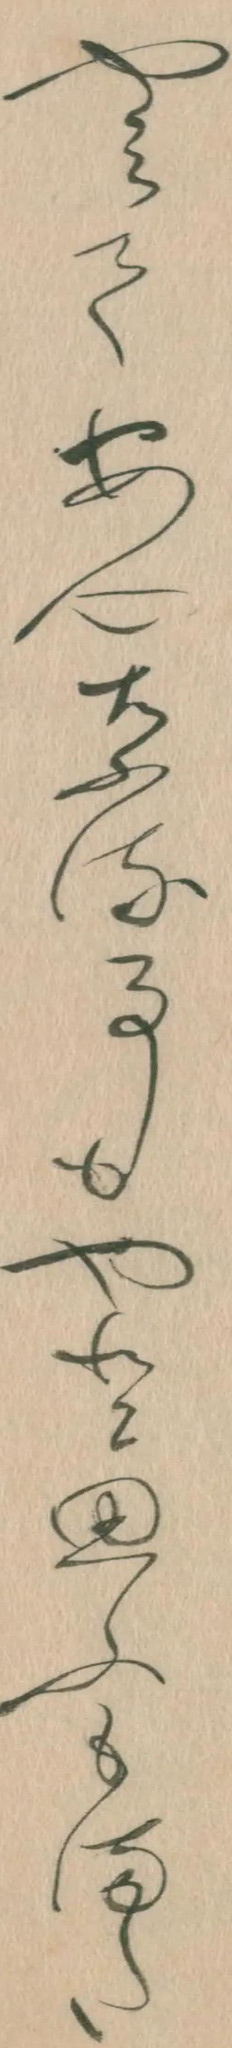やみて安心なる事もやと思ふもまた
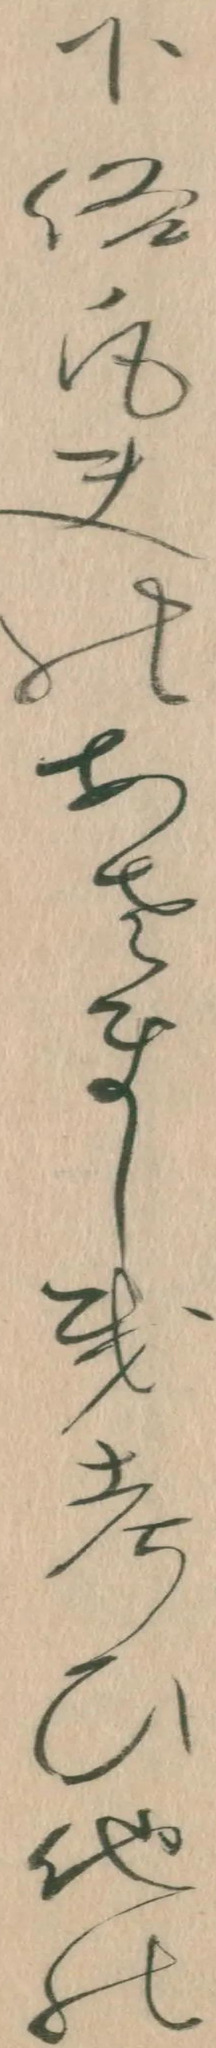下俗凡夫のあさましき考ひ他の
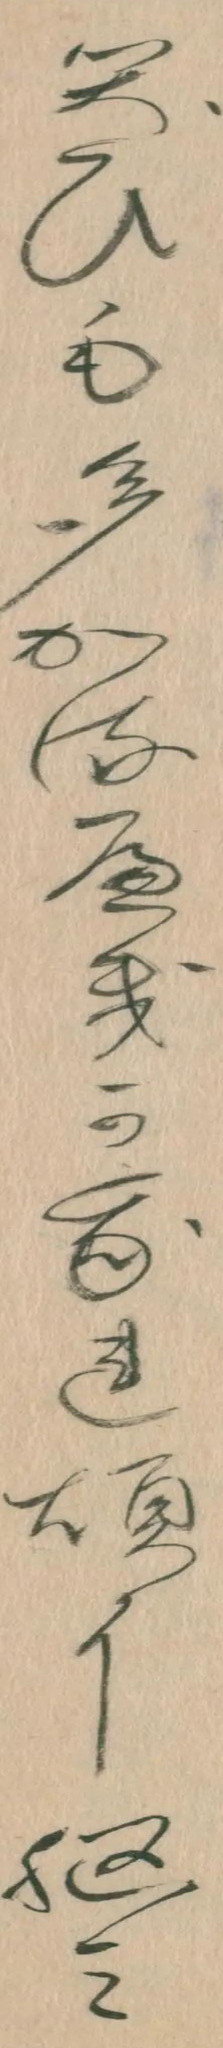災ひも多かるへきか我れ煩に脳み
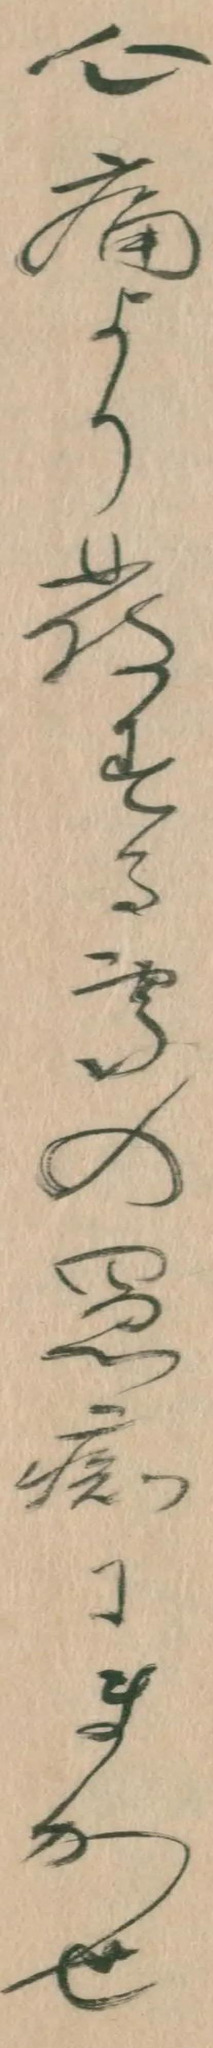心痛より発する處の愚痴にまかせ
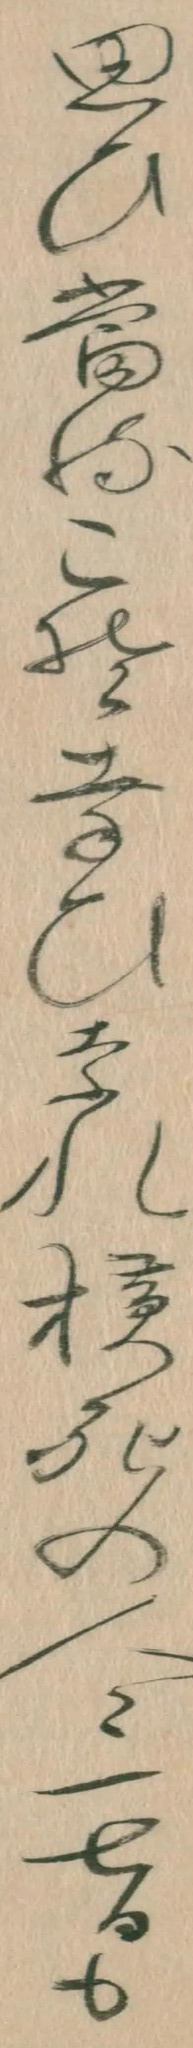思ひ当るこそ幸ひなれ横死の人々一七日も
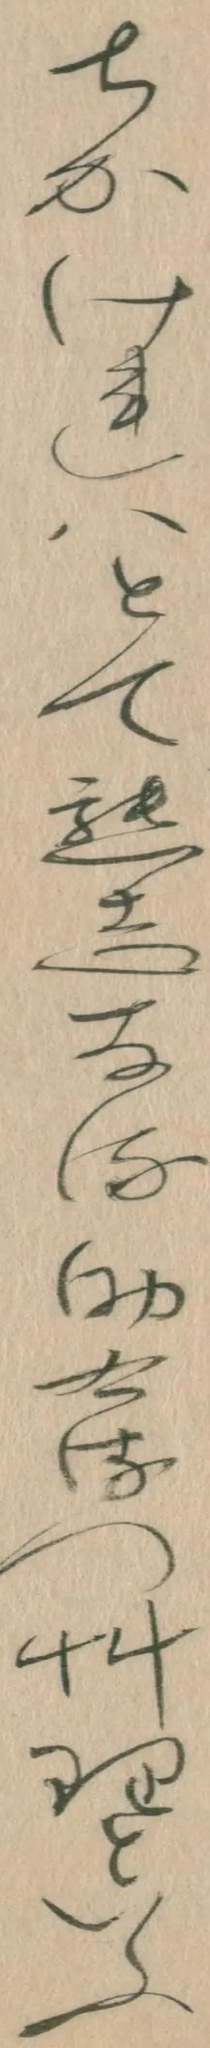ちかけれはとて懇志なる助右衛門竹理といふ
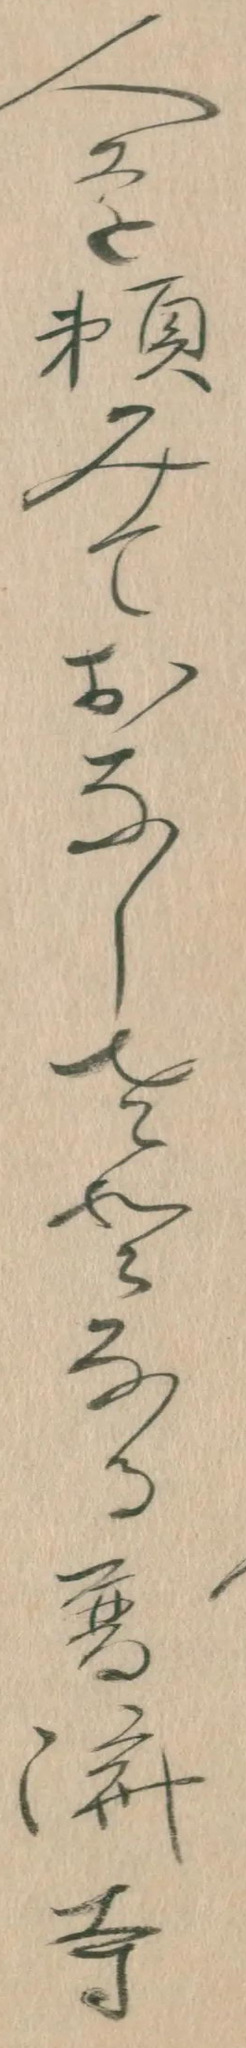人を頼みておなしさとなる普済寺
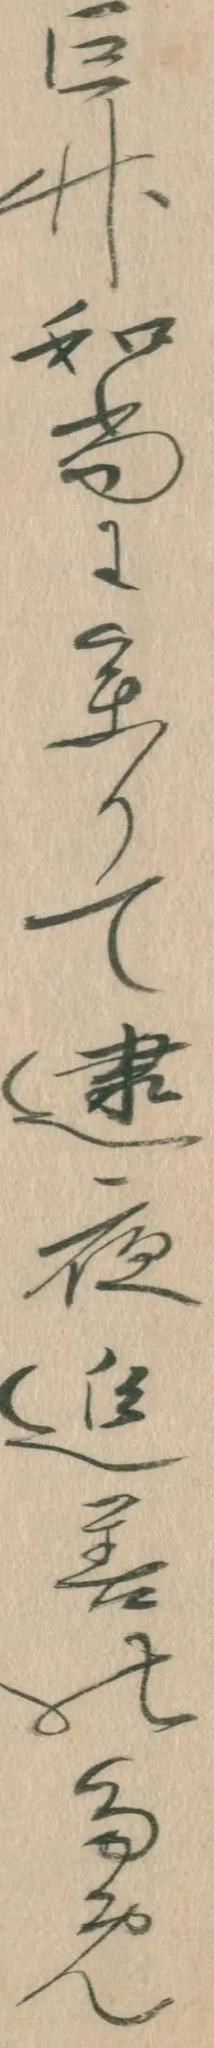巨竹和尚に参りて逮夜進善のため
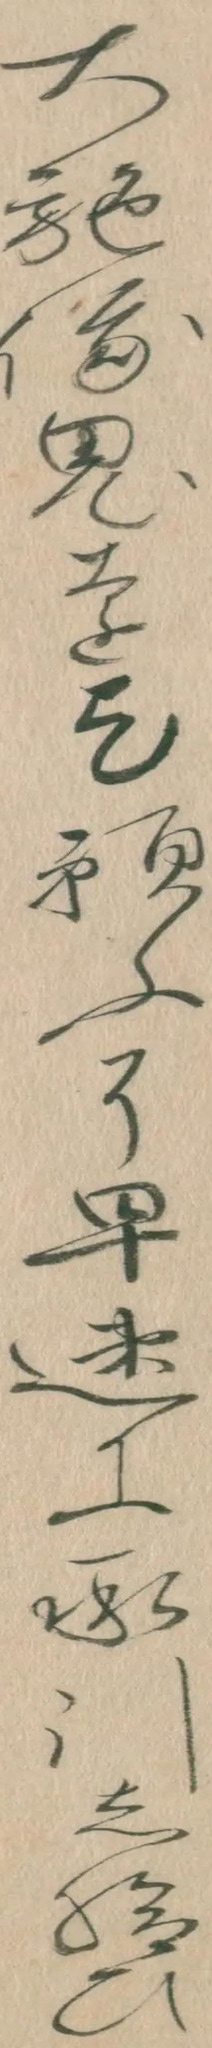大施餓鬼を乞頼ふに早速に承引し給ひ
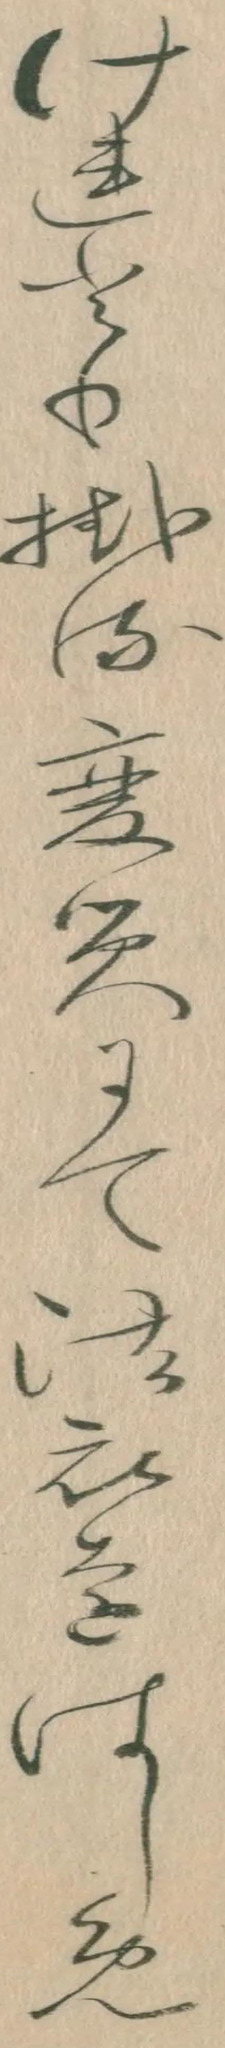けれとも掛る変災にて法衣をはしめ
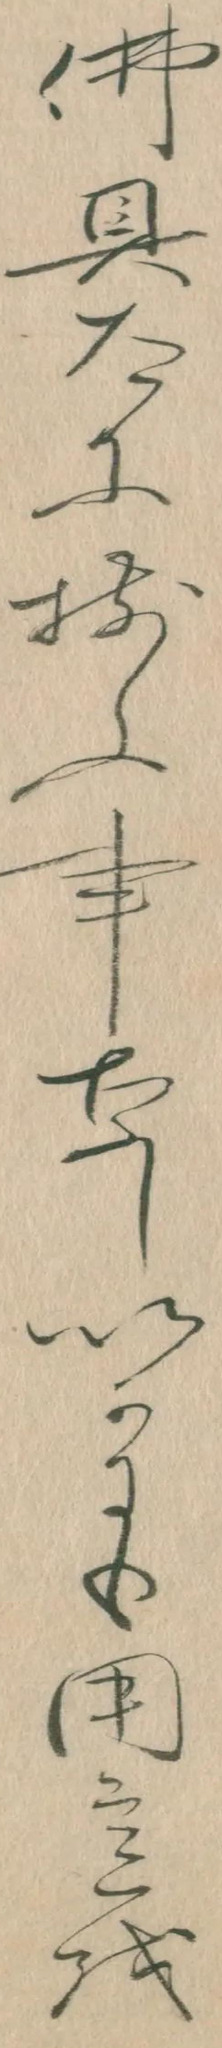仏具たに揃ふ事なしいかにも用意を
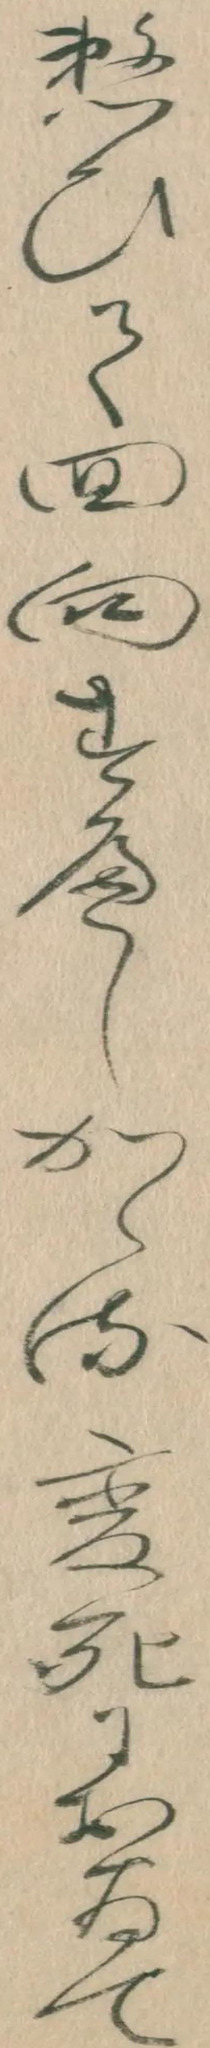整ひて回向すへしかゝる変死におゐて
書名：俗語之種. [5]
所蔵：国立国会図書館 National Diet Library, JAPAN
